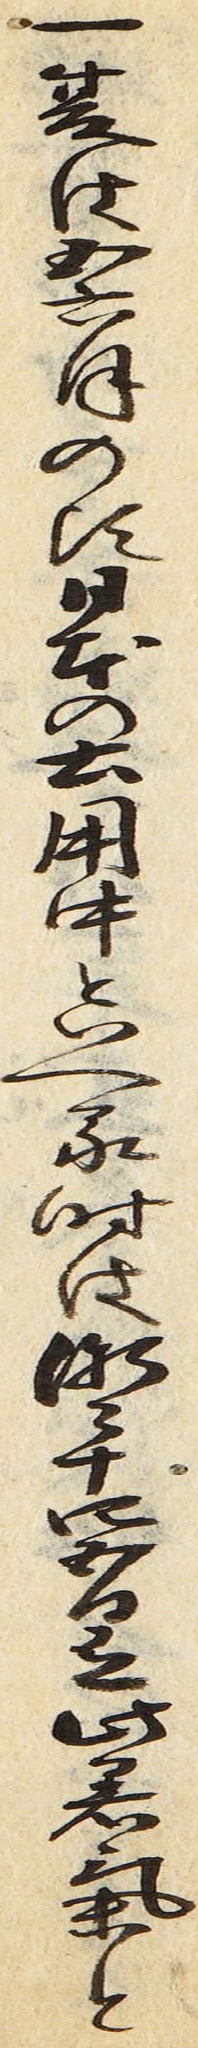一夏は五六月の頃日本の土用中といへる時は漸々十四五日有此暑気と
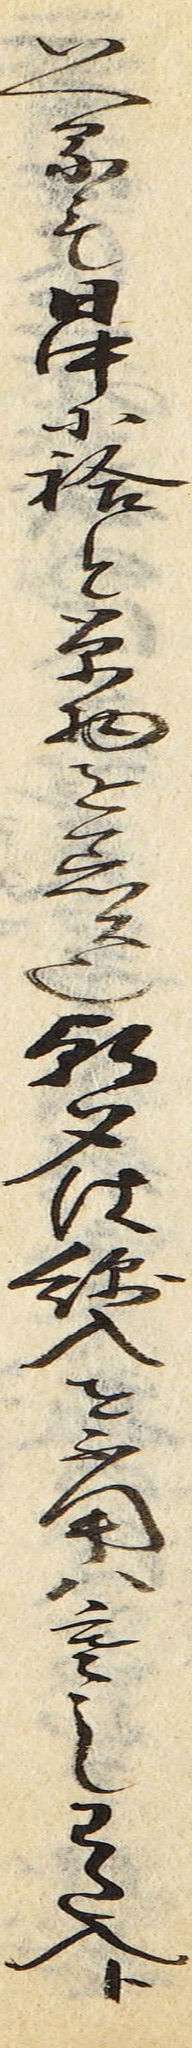いへるも日中に袷と単物を着す也朝夕は綿入を不用は寒しわた入と
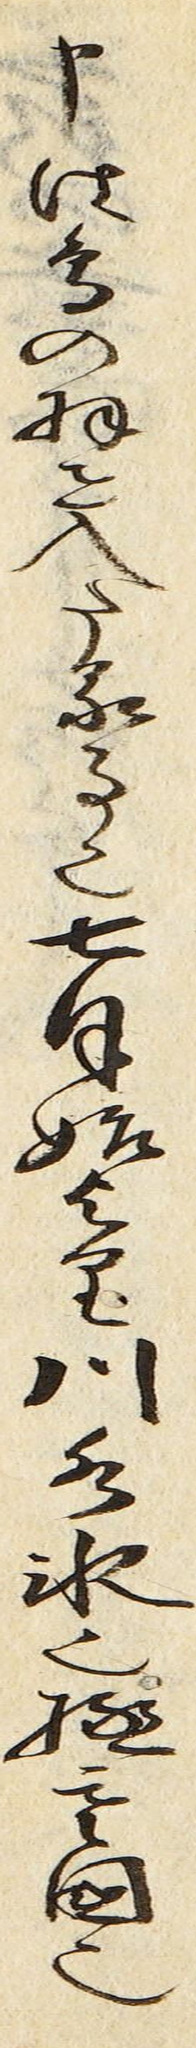申は鳥の羽を入たる事也七月始より川水氷也極寒国也
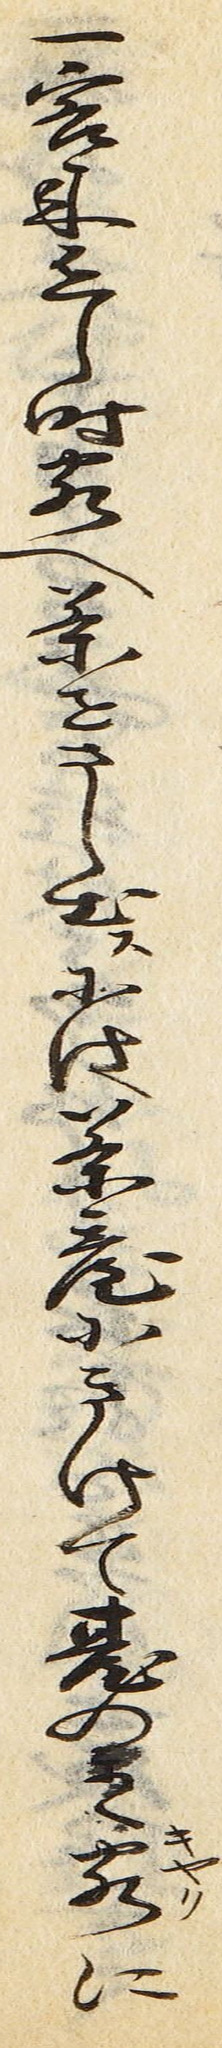一客来有し時客へ茶をさし出すには茶台にきけて台のく客に
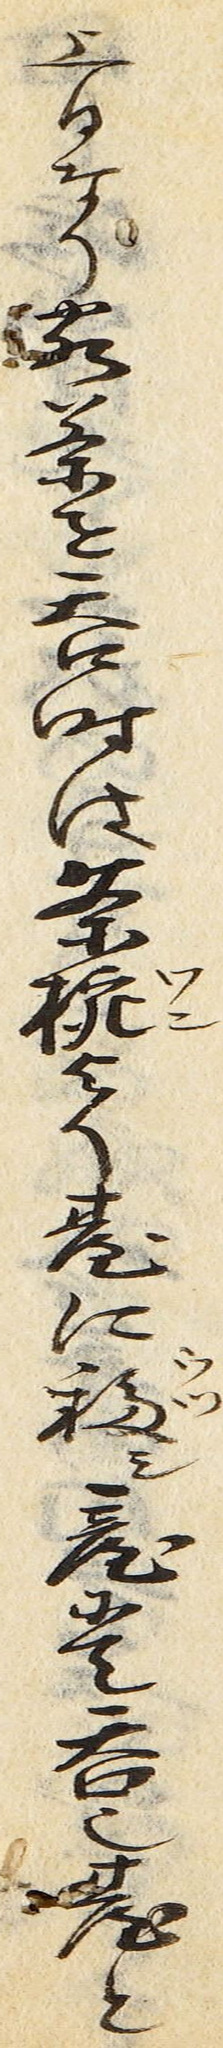上るなり客茶を呑時は茶碗より代台に移し台にて呑也台と
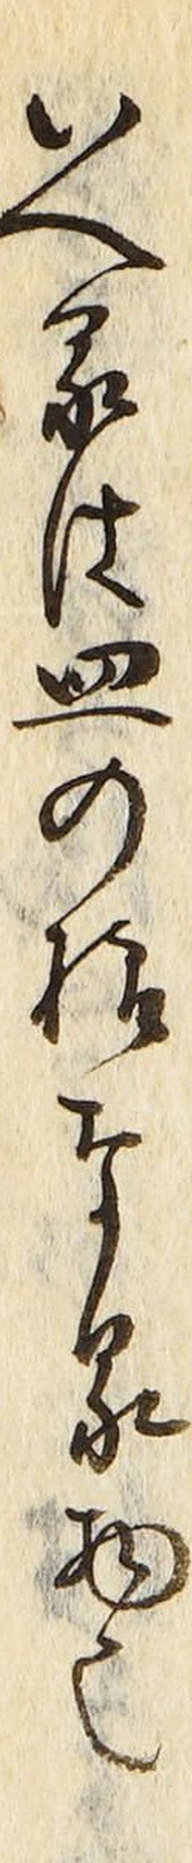いへるは皿の様なる物也
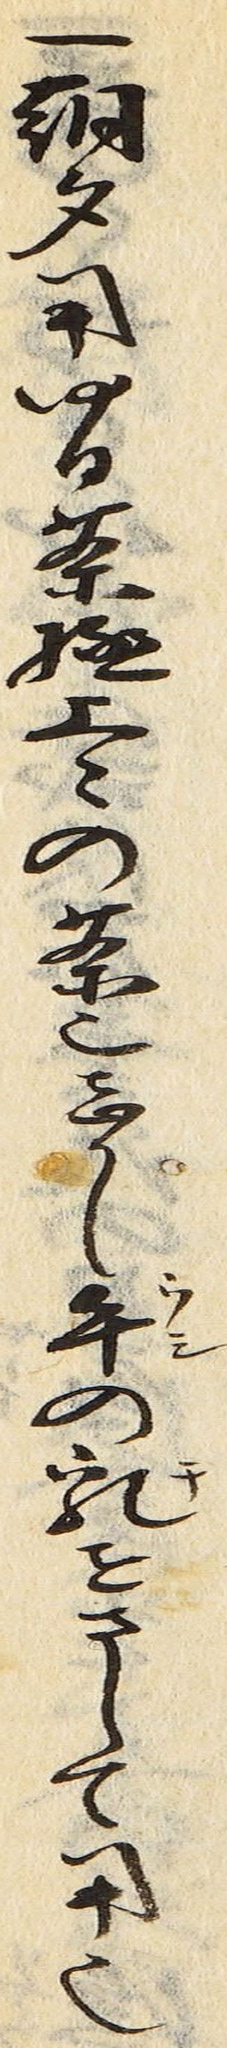一朝夕用いる茶極上々の茶也しかし牛の乳をさして用也
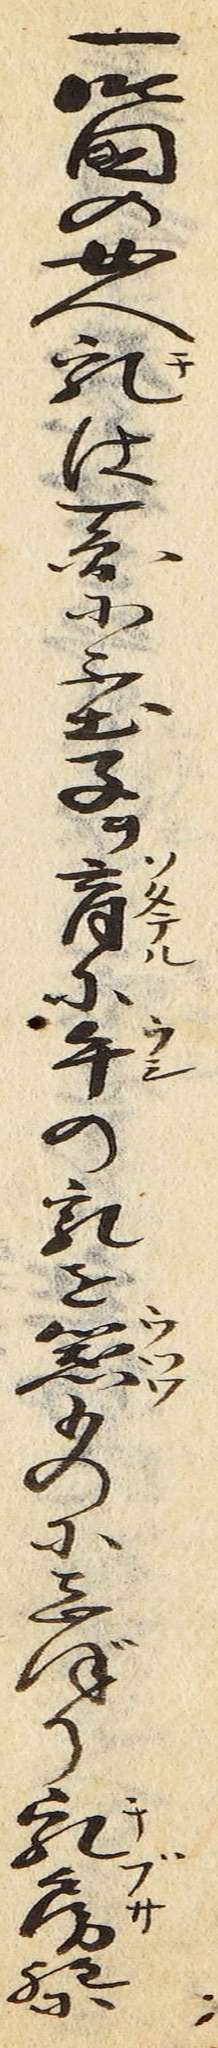一此国の女人乳は一円に不出子を育に牛之乳を器ものにしぼり乳房程に
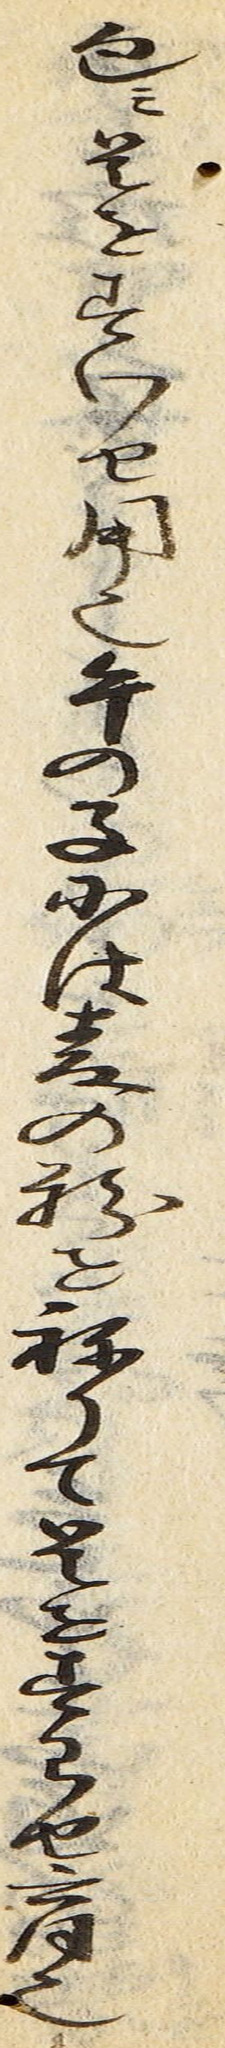包み是をすわせ用也牛の子には麦の粉をねりて是をすわせ育也
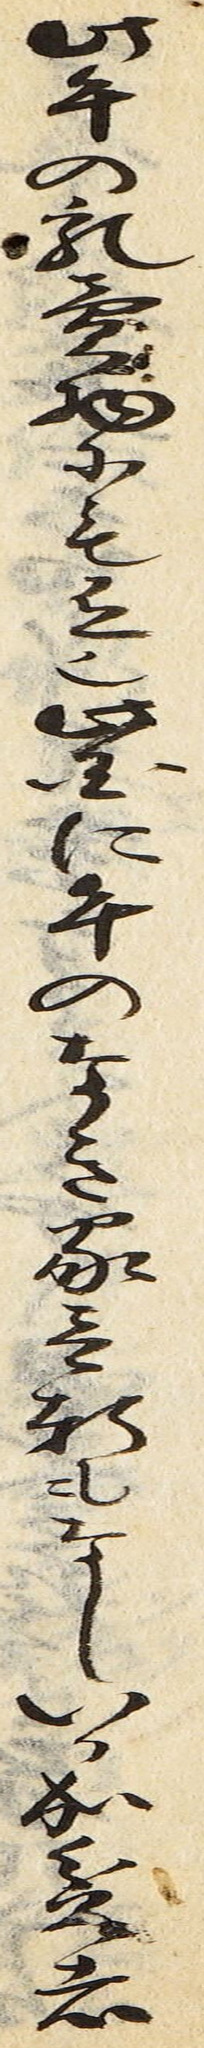此牛の乳売物にも有也此国に牛のなき家壱軒もなしいか成貧者
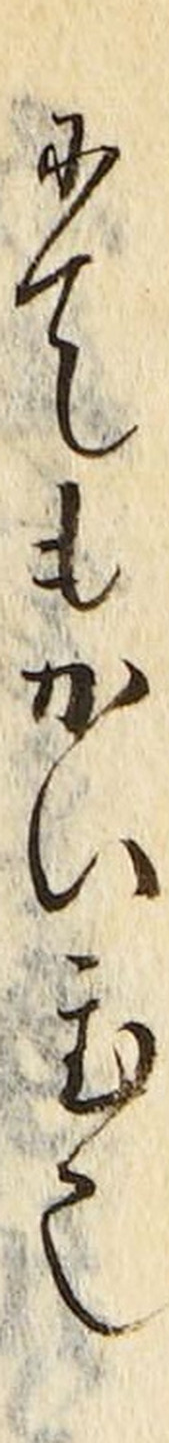にてもかい置也
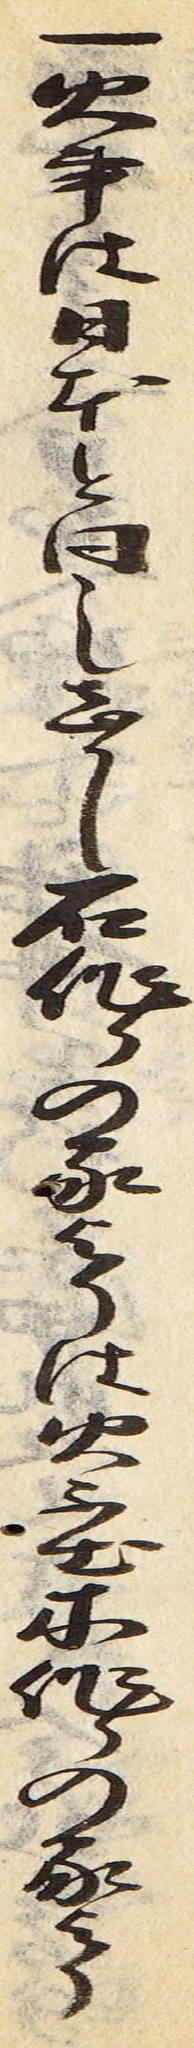一火事は日本と同ししかし石作りの家よりは火不出木作りの家より
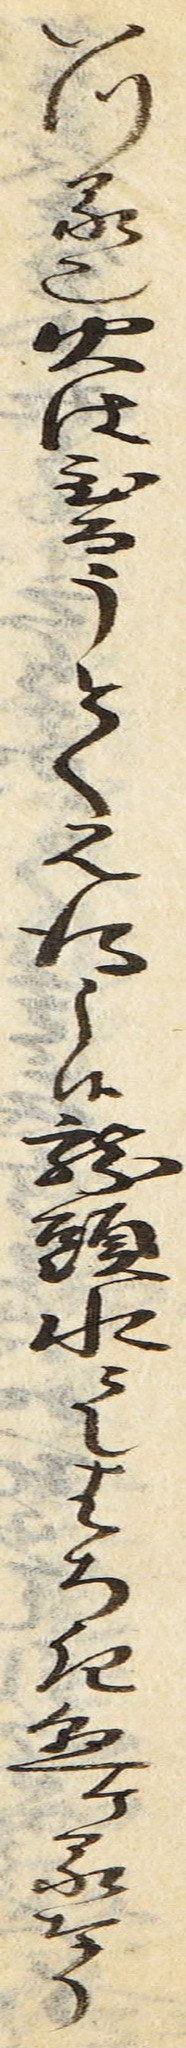いつる也火は至而うとく見得申候龍頭水にしはろき懸けるなり
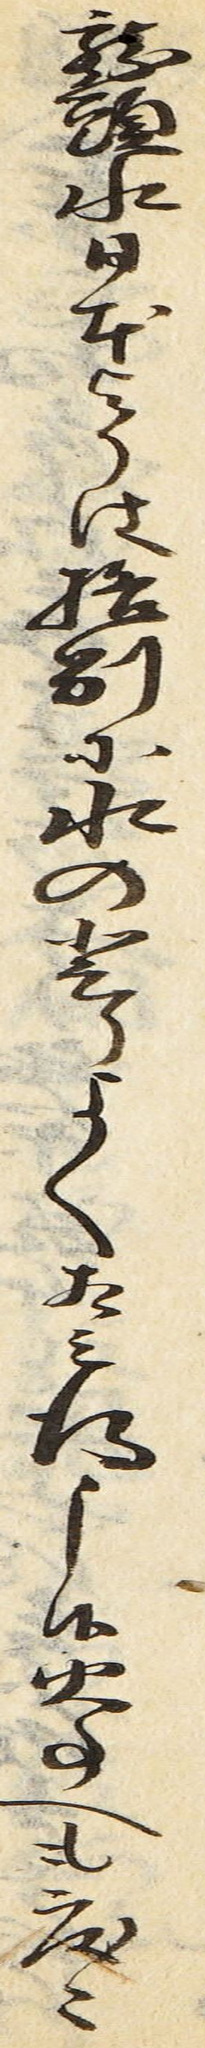龍頭水日本よりは格別に水の登りよく相み得申候火事へも度々
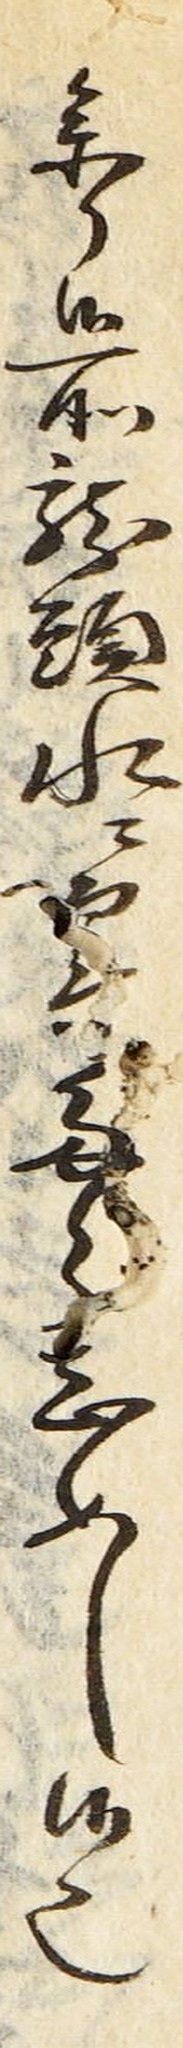参り候所龍頭水に而多々しめし候也
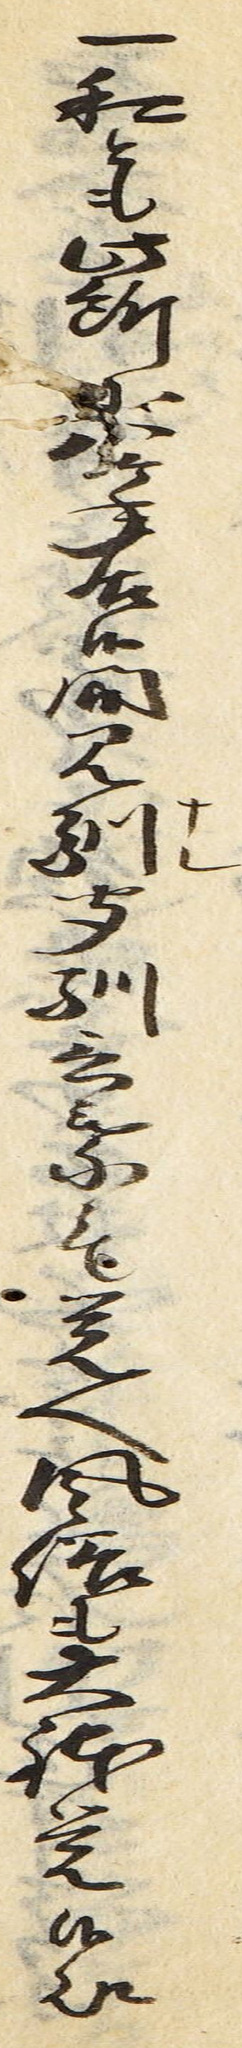一私とも此所に八ヶ年居候間見馴聞馴言葉も覚へ風俗も大躰覚候処
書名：外国漂流記
